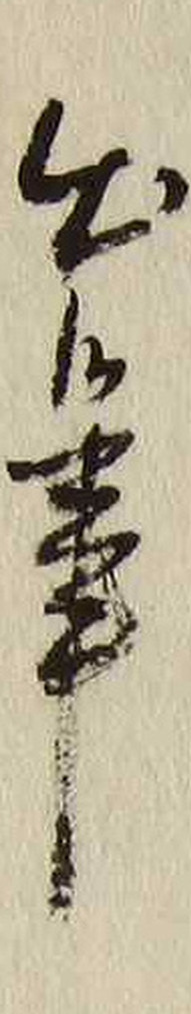出候事
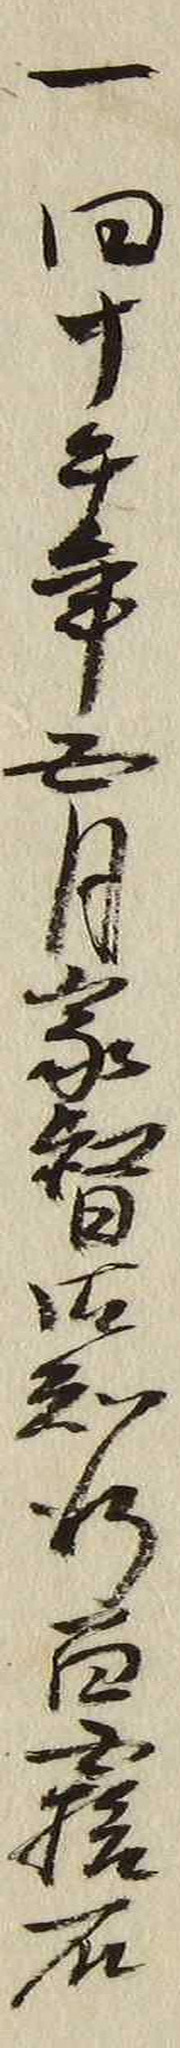一同十午年五月家督御知行百五拾石
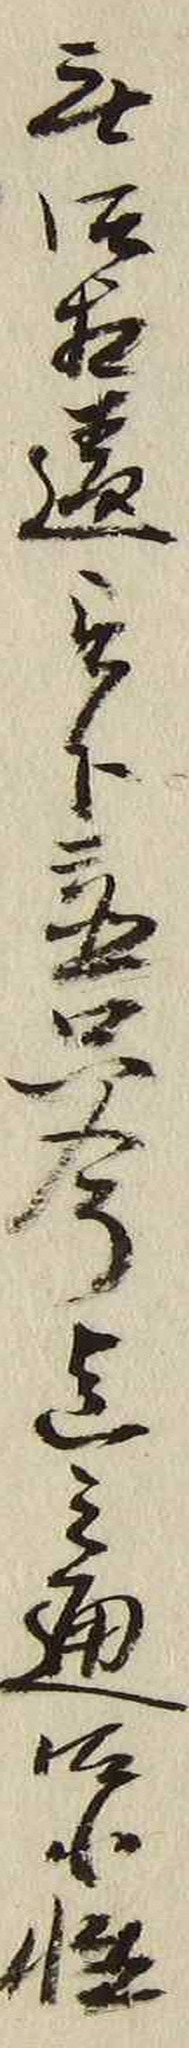無御相違被下置只今迄之通御小性
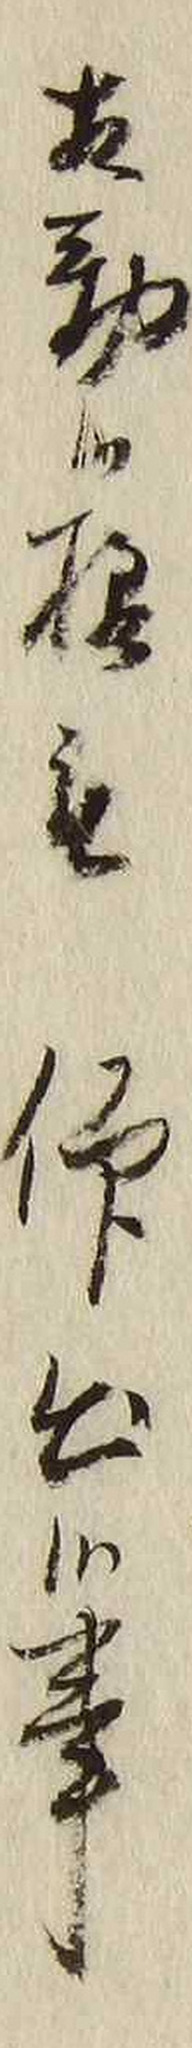相勤候様被仰出候事

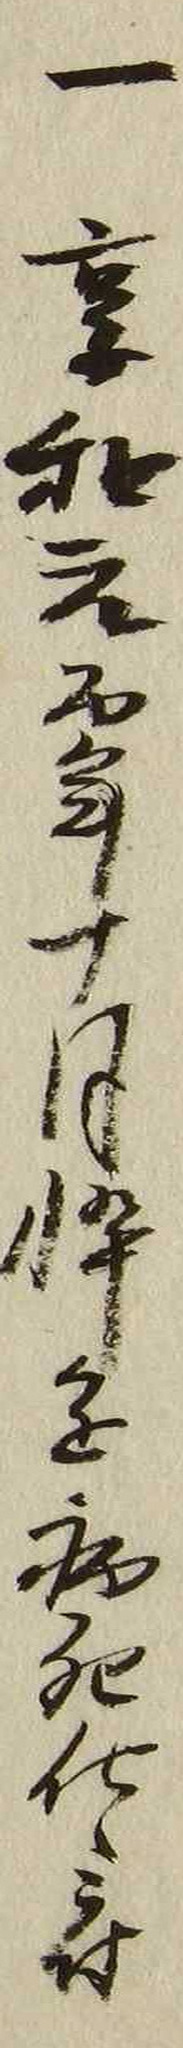一享和元酉年十月忰進病死仕候ニ付
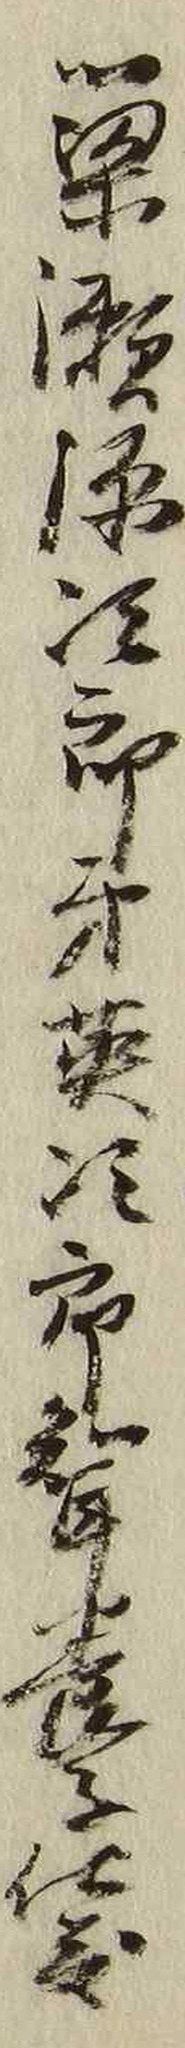簗瀬源次郎弟英次郎婿養子仕度
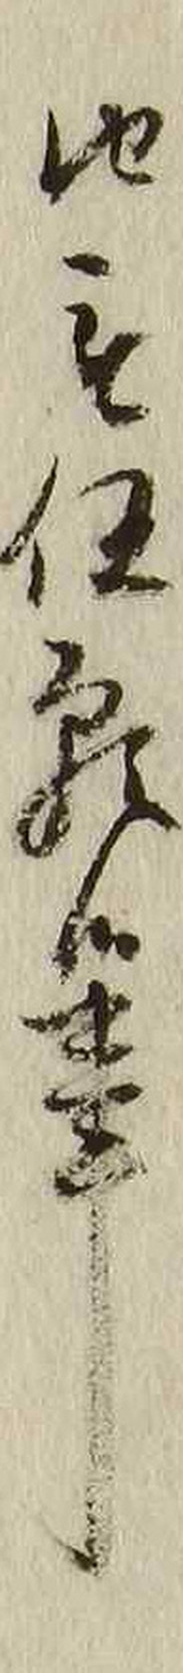由被任願候事
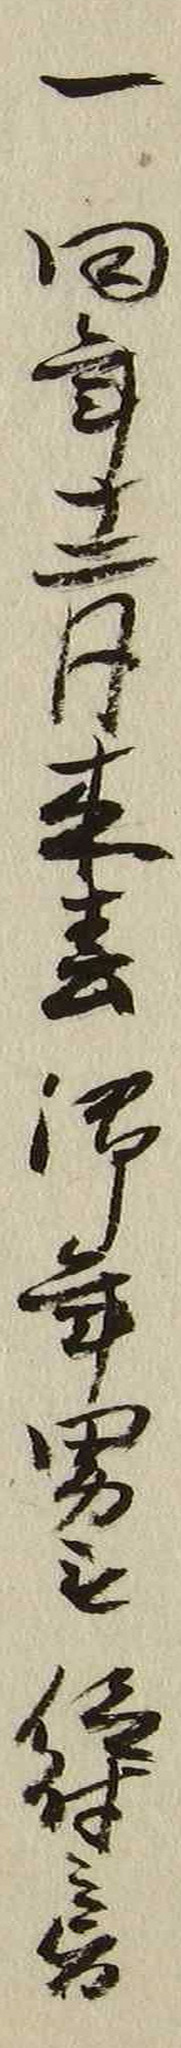一同年十二月来春御年男被仰付之旨
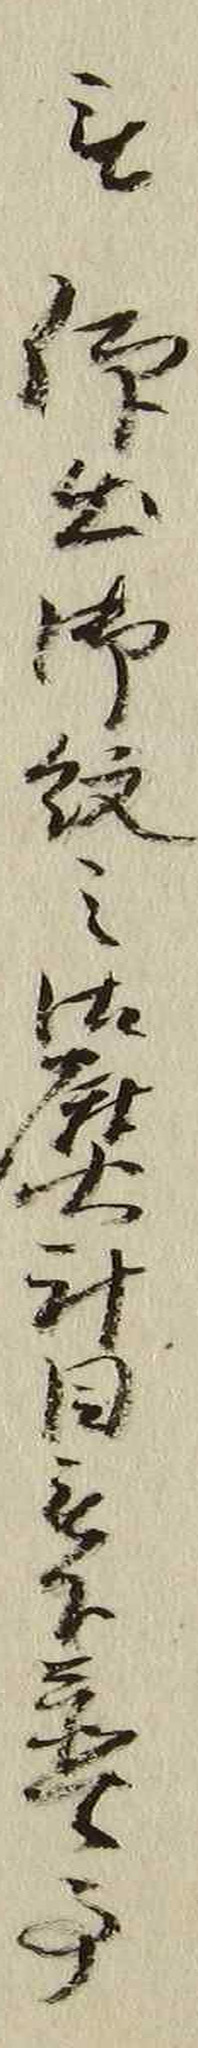被仰出御紋之御熨計目被下置候事
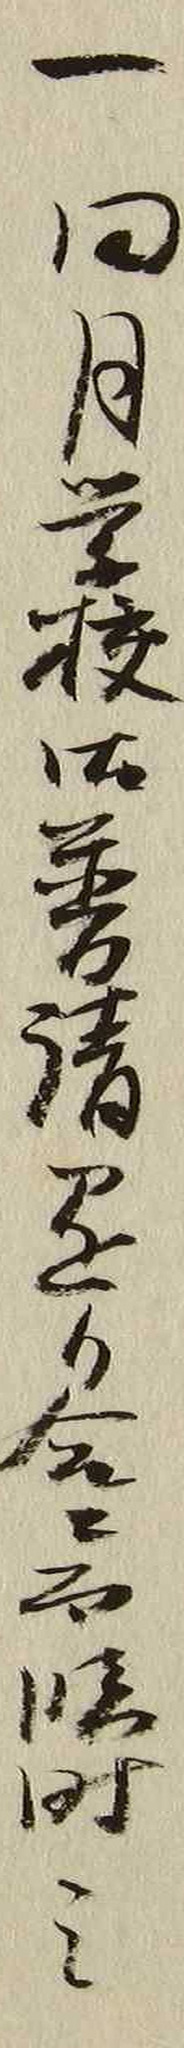一同月学校御普請懸り合ニ而臨時之
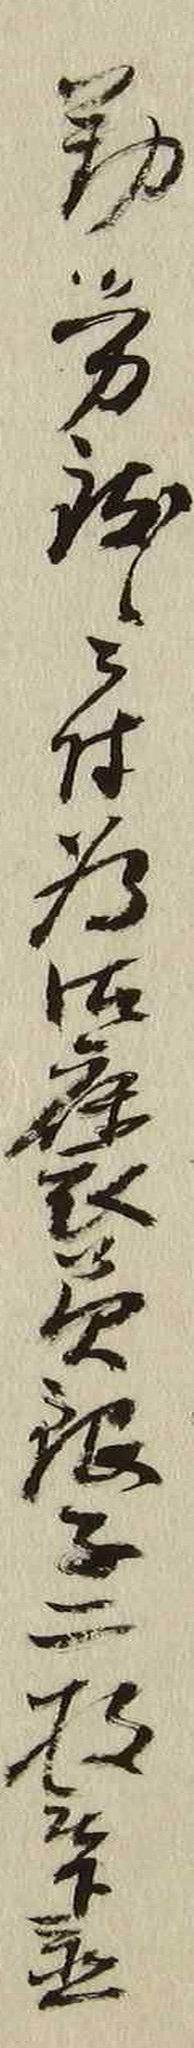勤労致候ニ付為御褒美銀子二枚被下置
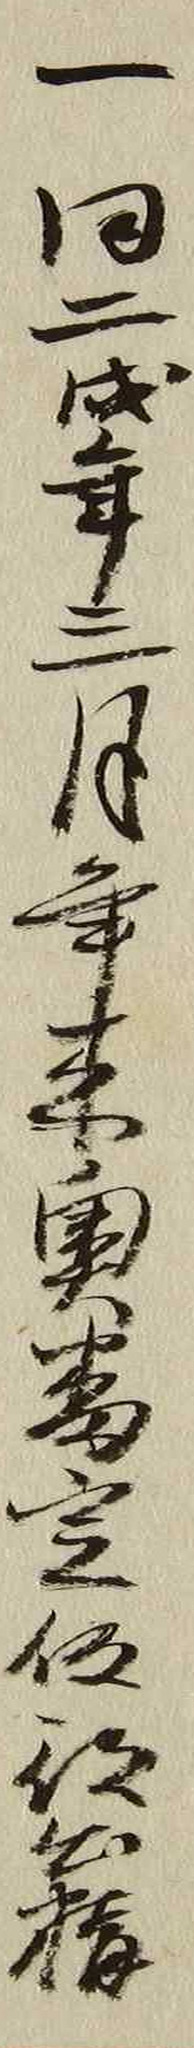一同二戌年三月年来奥番定仮役出精
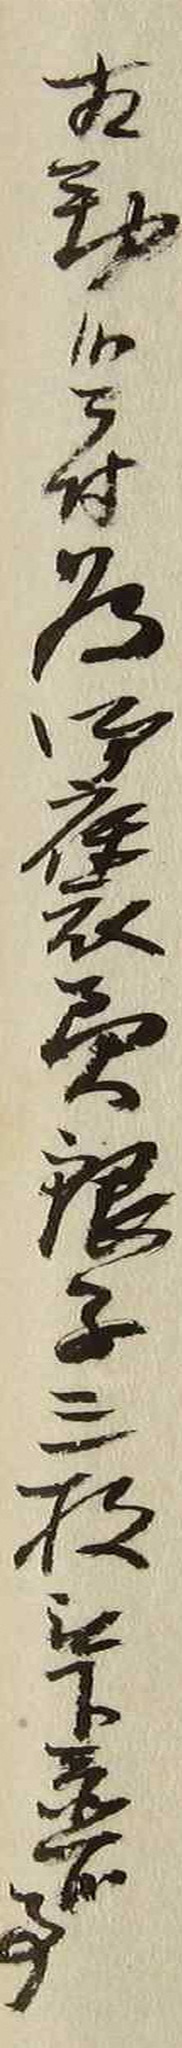相勤候ニ付為御褒美銀子三枚被下置候事
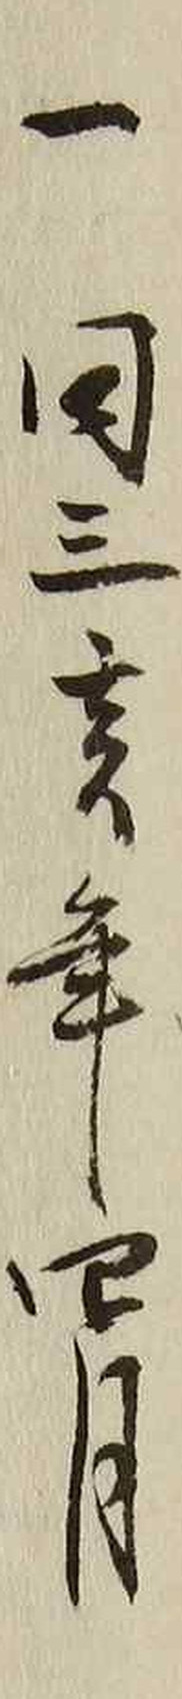一同三亥年四月
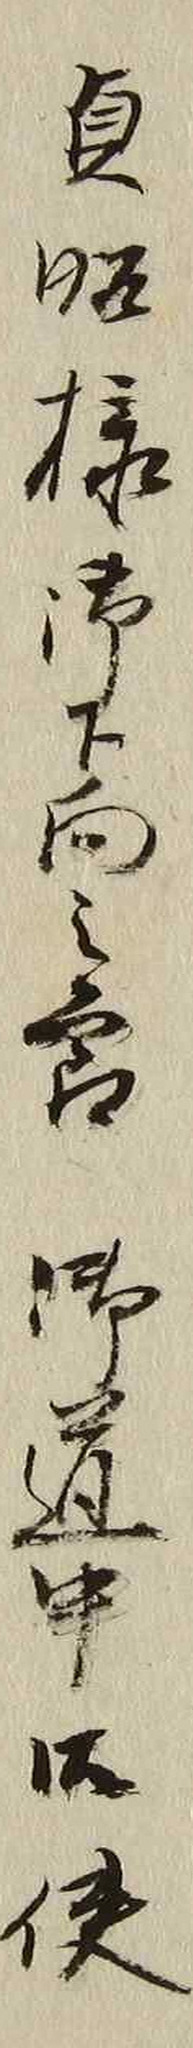貞昭様御下向之節御道中御使
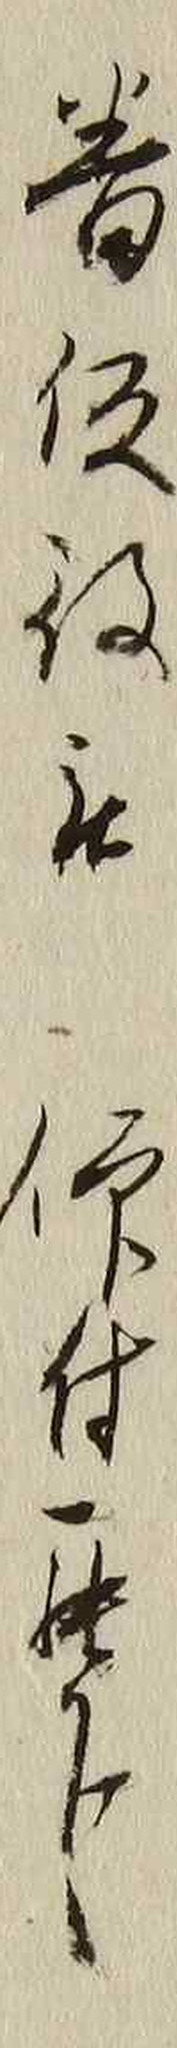番仮役被仰付罷下候
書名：諸士系譜　巻之345　も之部1
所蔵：会津若松市立会津図書館
